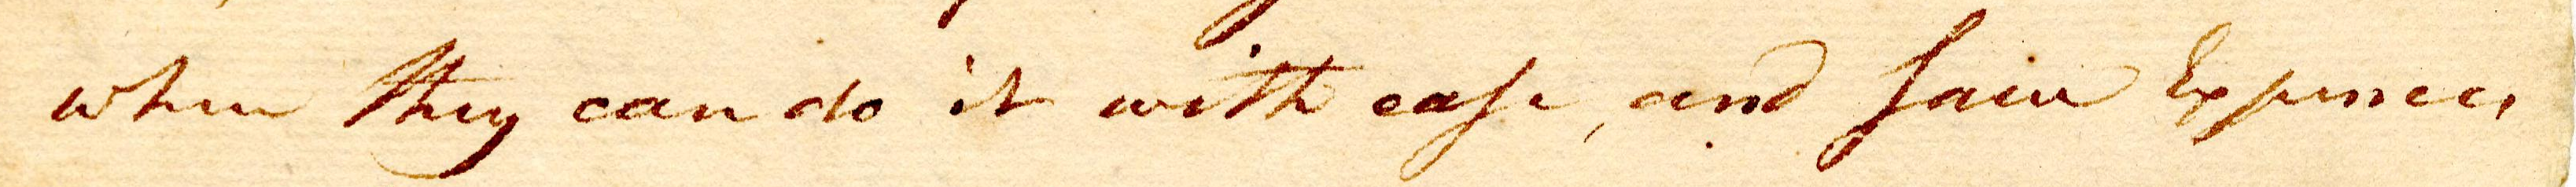when they can do it with ease, and save Expences
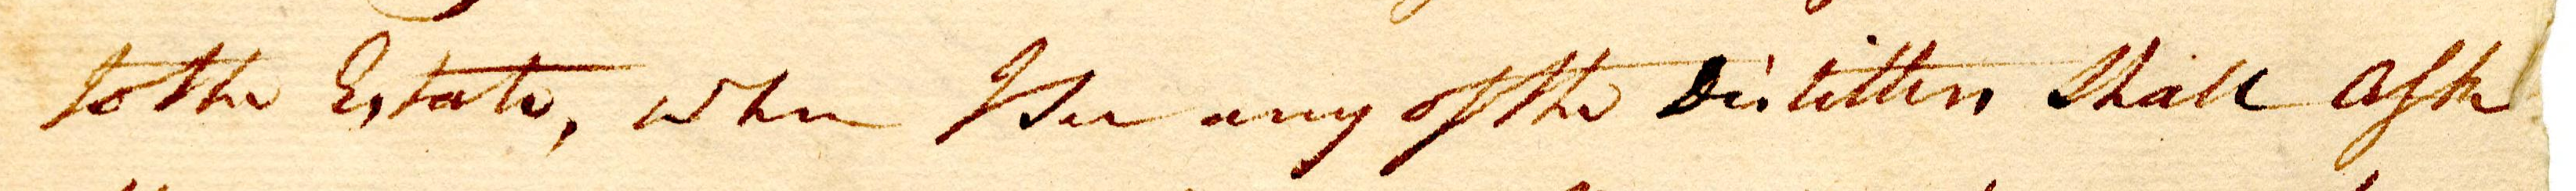to the Estate, when I see any of the Distillers shall ask
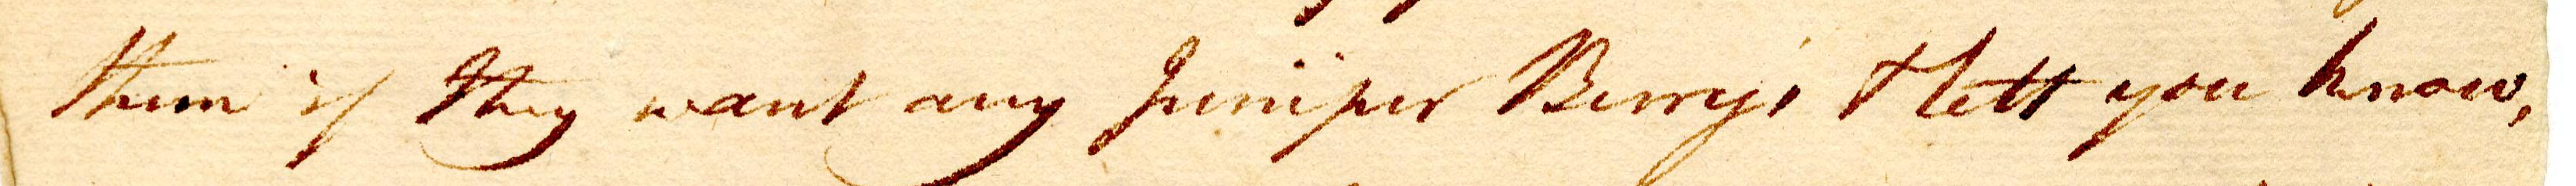them if they want any Juniper Berrys & lett you know,
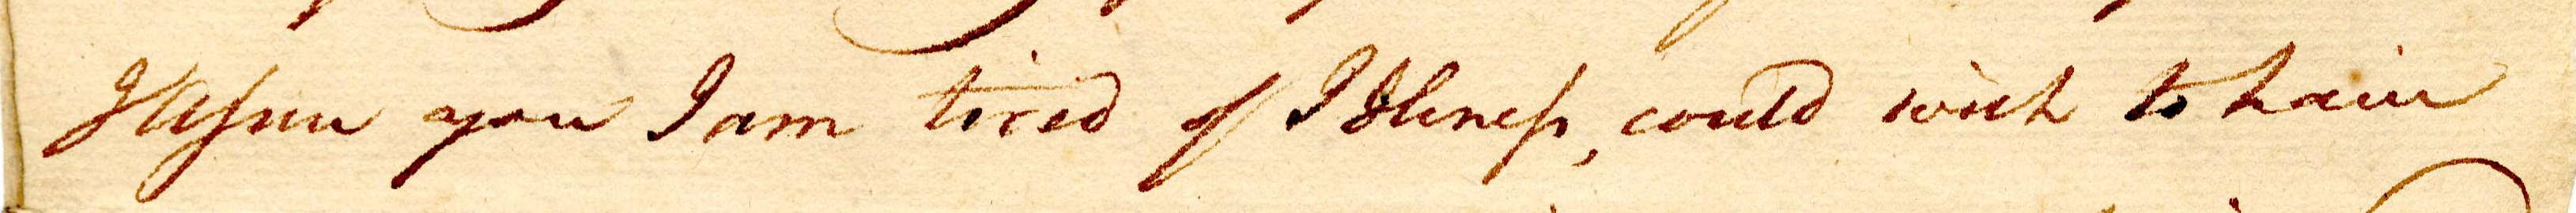I asure you I am tired of stench, could wish to have
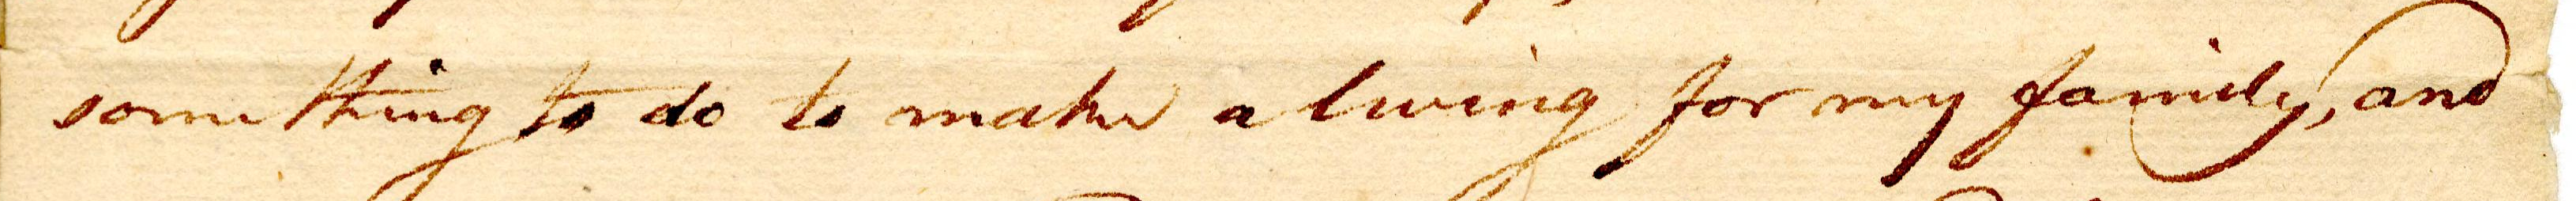something to do to make a living for my family, and
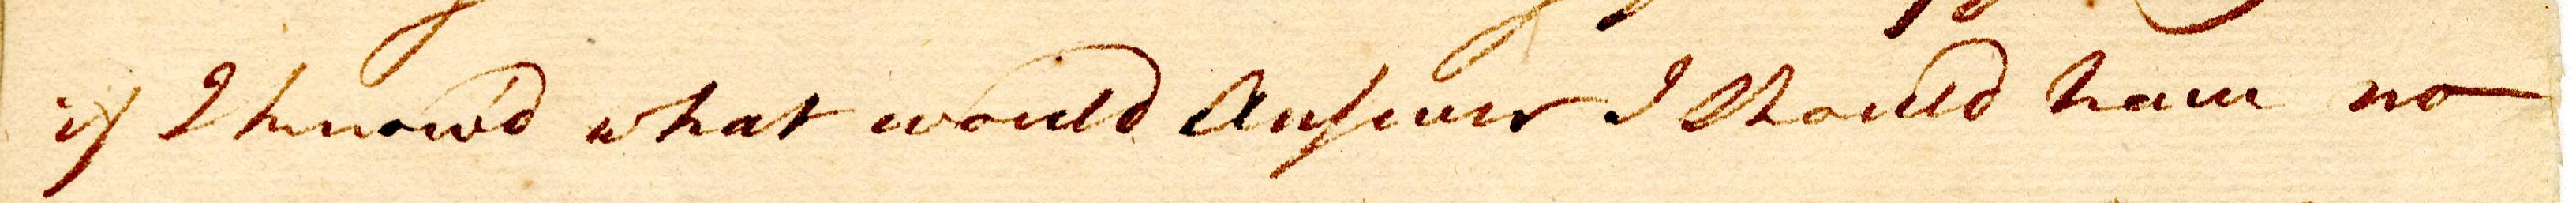if I know'd what would answer I should hav no
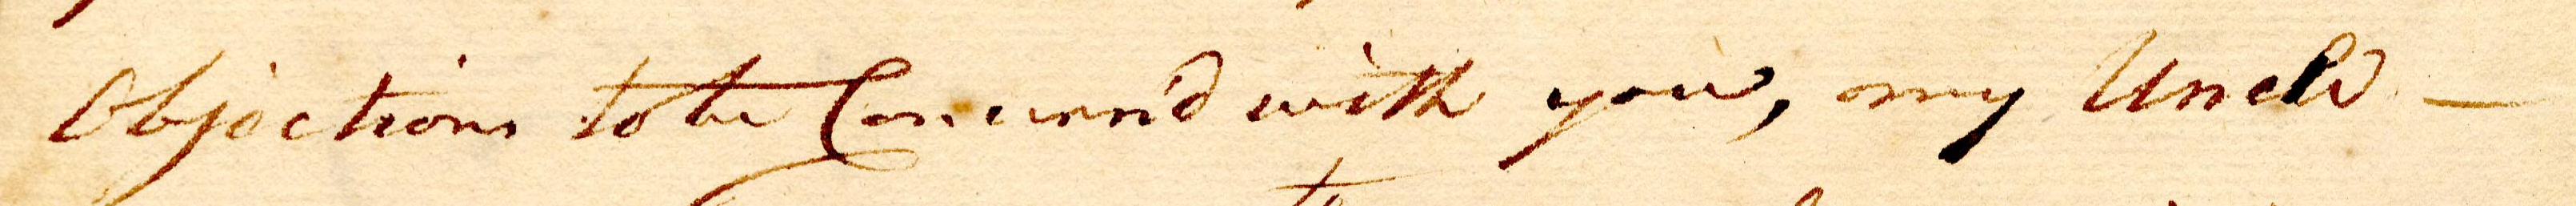Objections to be Concern'd with you, only Uncle.-
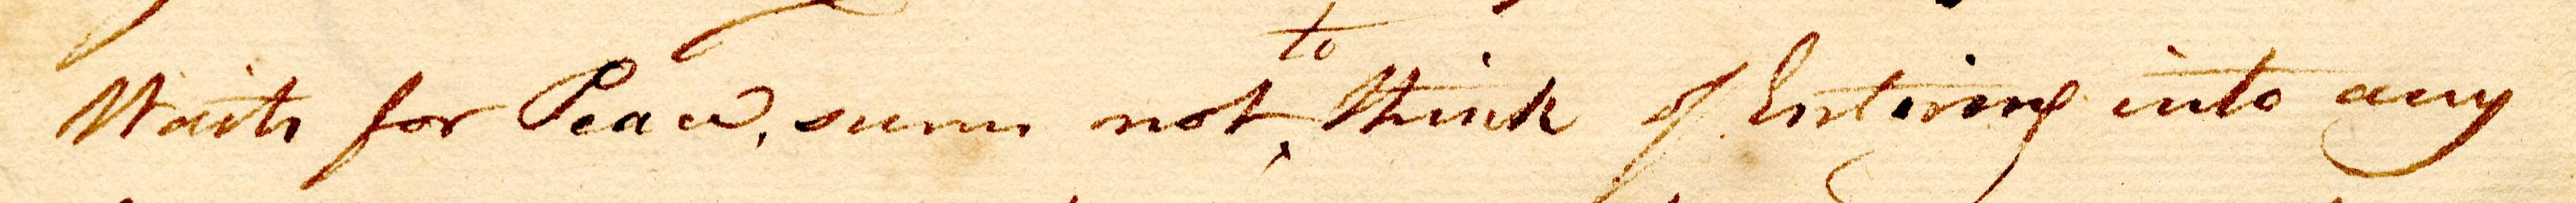Waits for Peace some not ^ think of Entering into any
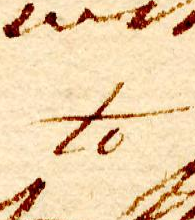to
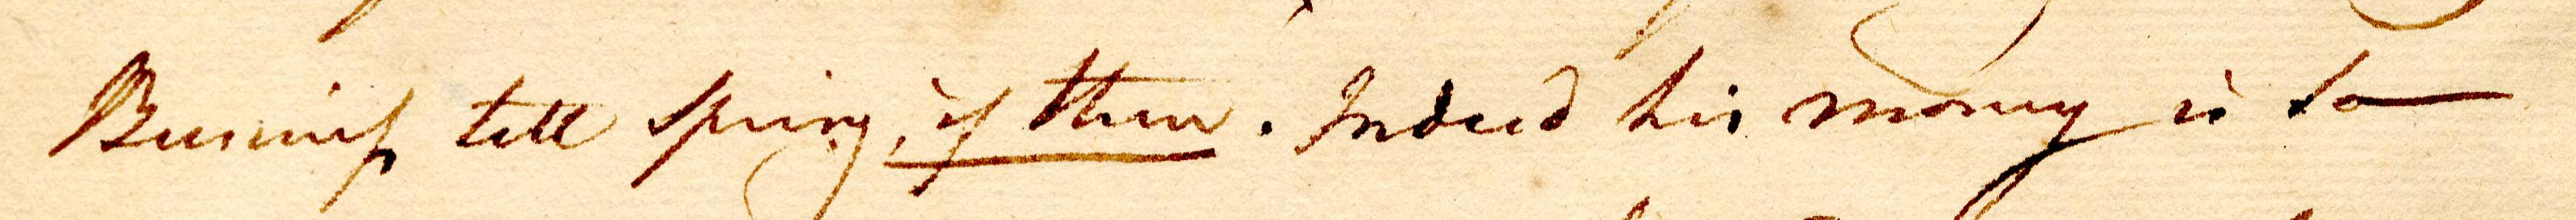Business till spring, if then. Indeed his money is so
